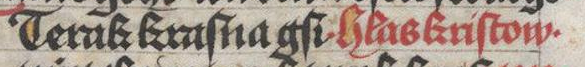Terak kraſna gſi.Hlas kriſtow.
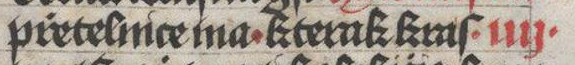pṙetelnice ma.kterak kraſ.iiij
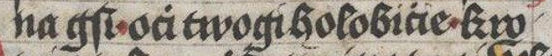na gſi. oċi twogi holobiċie.kro¬
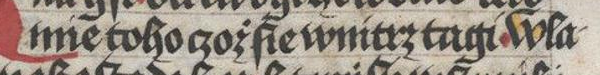mie toho czoż ſie wnítrz tagí.Wla¬
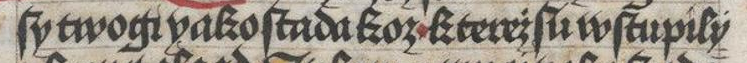ſy twogi yako ſtada koż.ktereżſu wſtupily
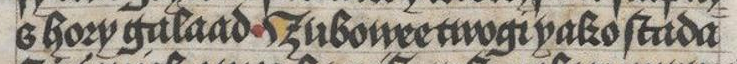s hory galaad.Zubowee twogi yako ſtada
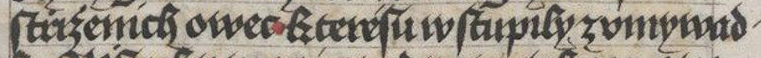ſtrṙiżeních owec.kteréſu wſtupily zvmywal¬
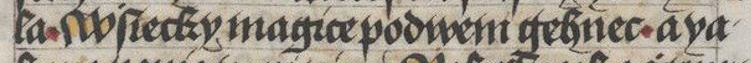la.Wẛiecky magíce podwem gehnec.a ya¬
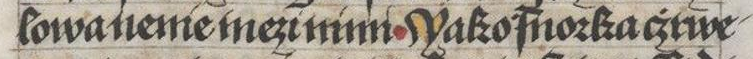lowa neníe mezi nimi.Yako ẛnorka cżrwe¬
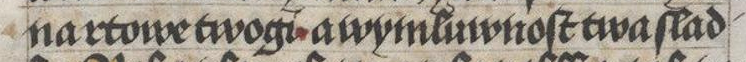na rtowe twogi.a wymluwnoſt twa ſlad¬
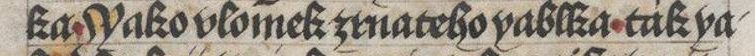ka.Yako vlomek zrnateho yablka.tak ya¬
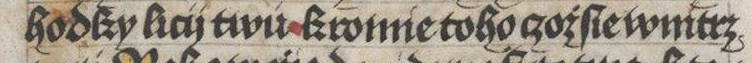hodky licij twú.kromíe toho czoż ſie wnitrz
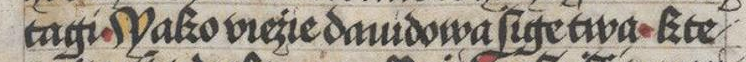tagi.Yako vieżie dauidowa ẛíge twa.kte¬
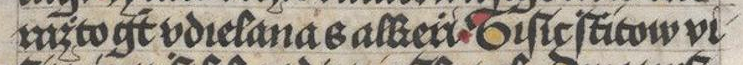rażto ḡt vdielana s alkeṙi.Tiſíc ẛtítow vi¬
